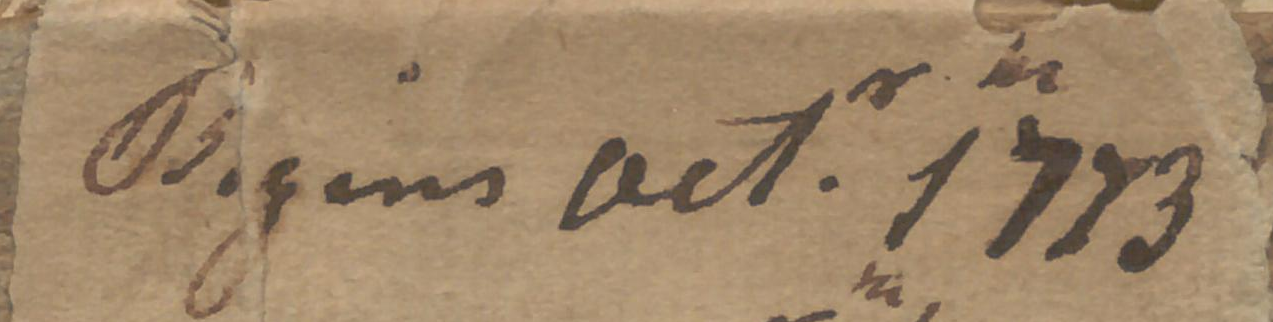Begins Oct^r. 1773
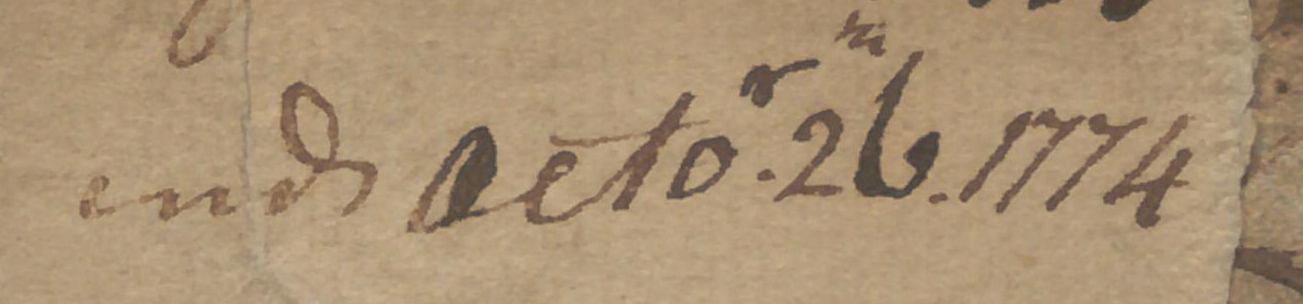ends Octo^r 26^th. 1774
